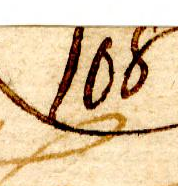108
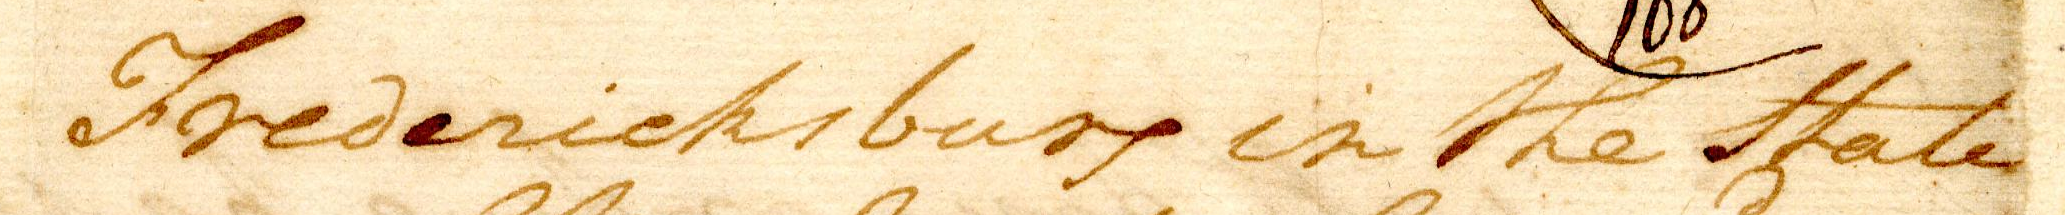Fredericksburg in the State
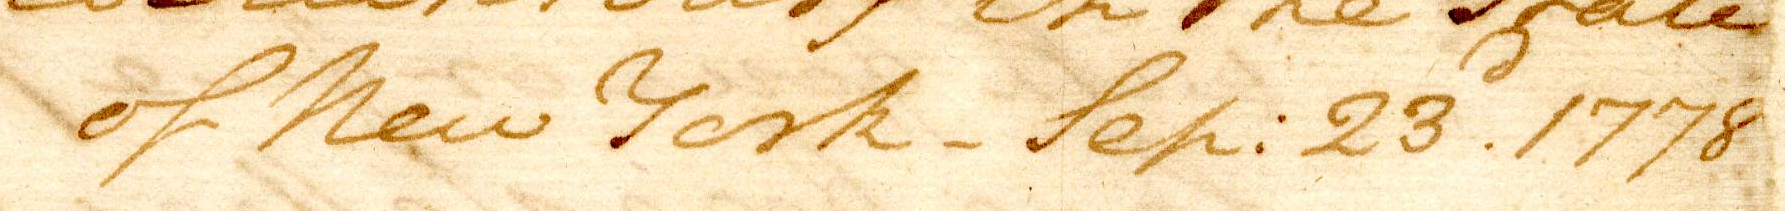of New York- Sep: 23^d. 1778
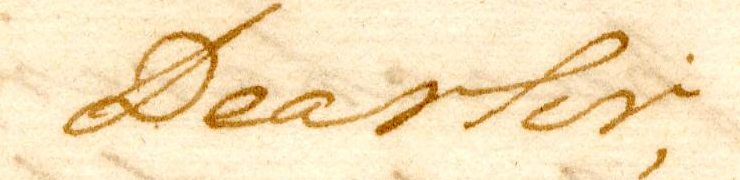Dear Sir,
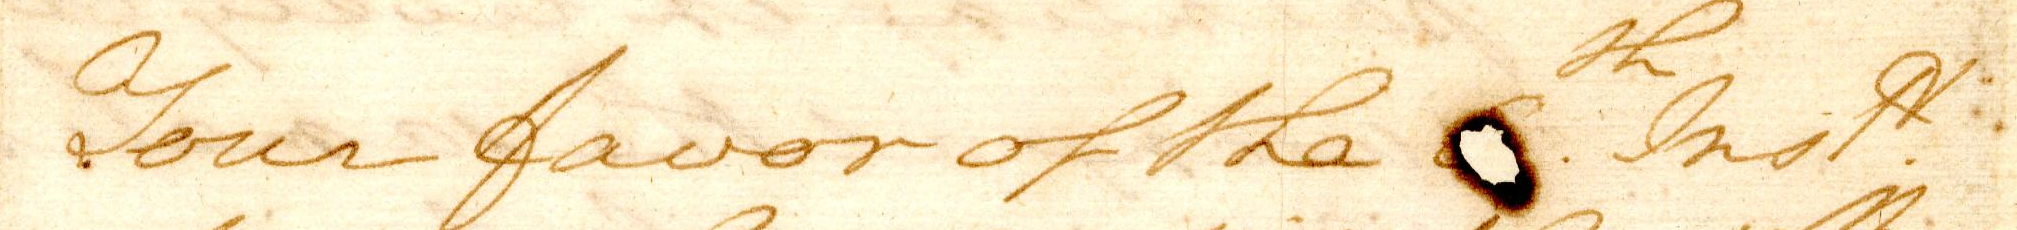Your favor of the 8^th. Ins^t.
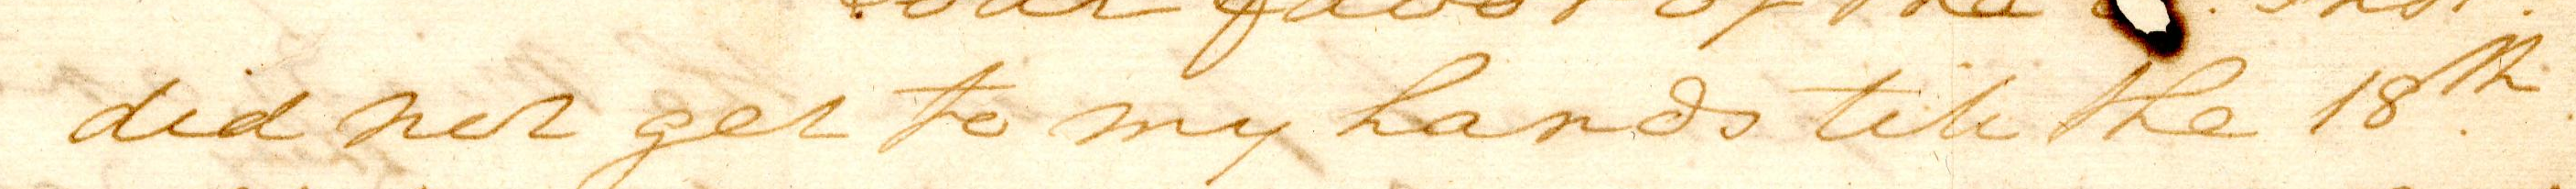did not get to my hands til the 18^th.
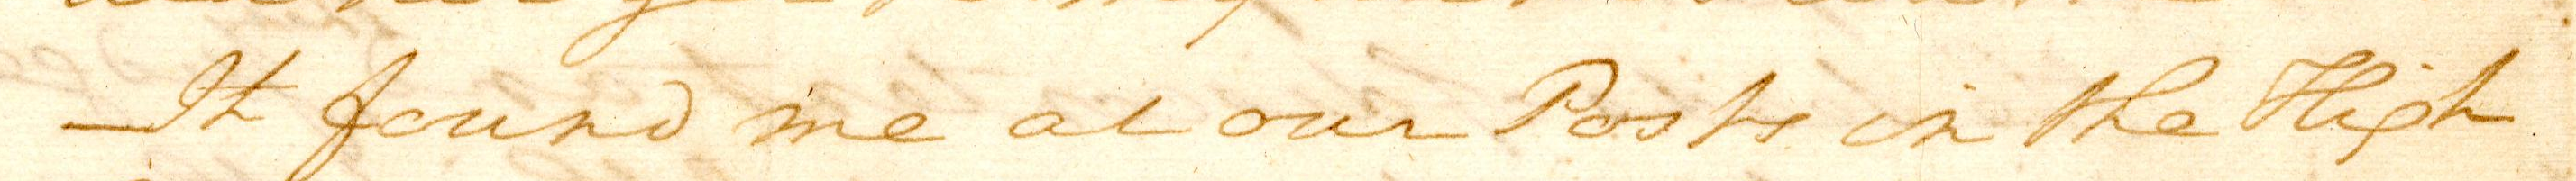It found me at our Posts in the High
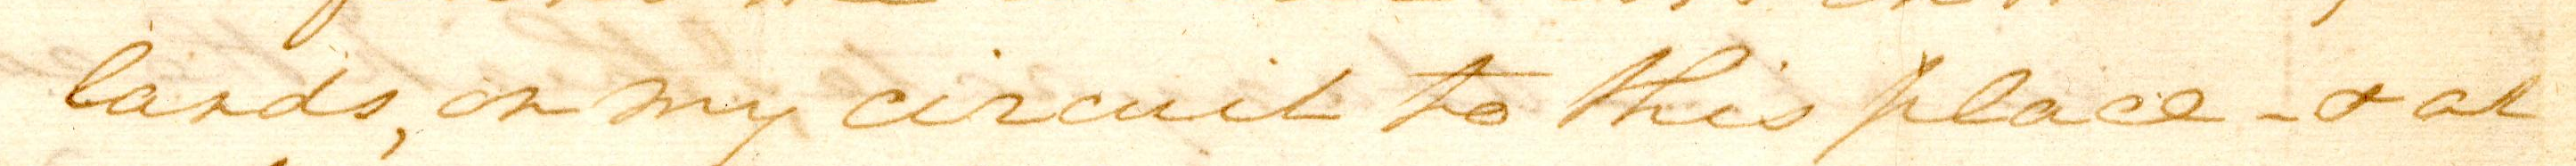lands, on my circuit to this place- & at
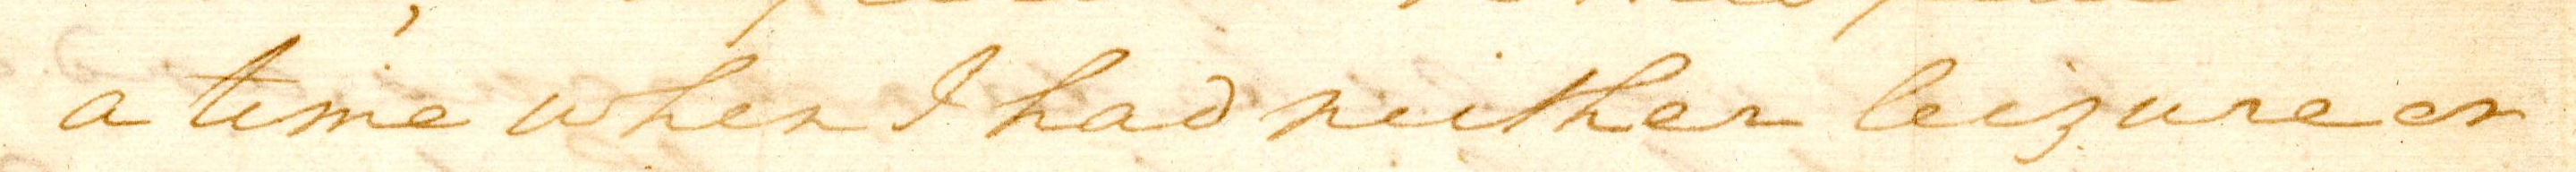a time when I had neither leizure or
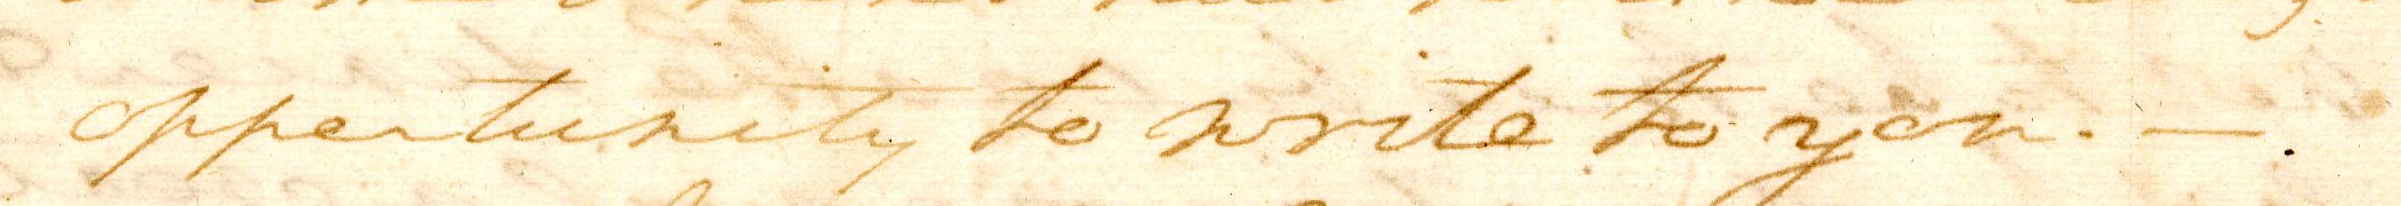oppertunity to write to you.-
